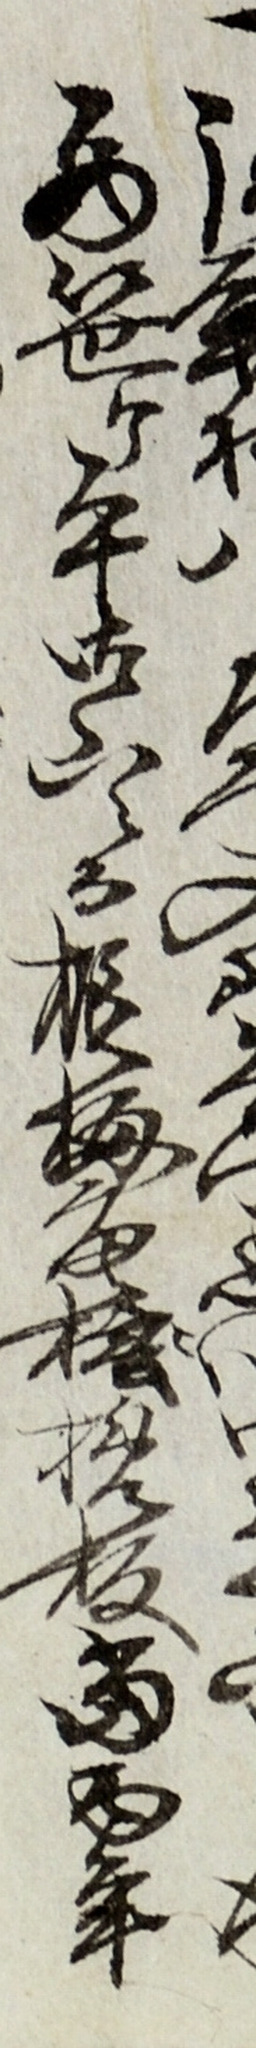西笹ケ平御山ニ而椴栂唐松挽板当酉年
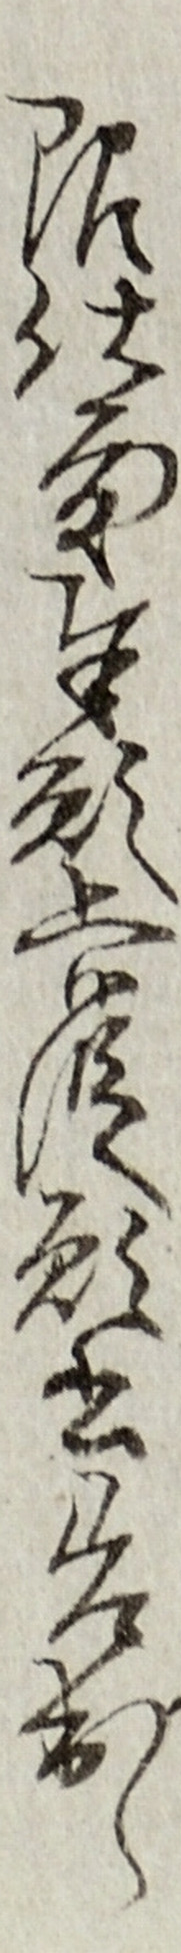限仕度奉願上候段願書差出候
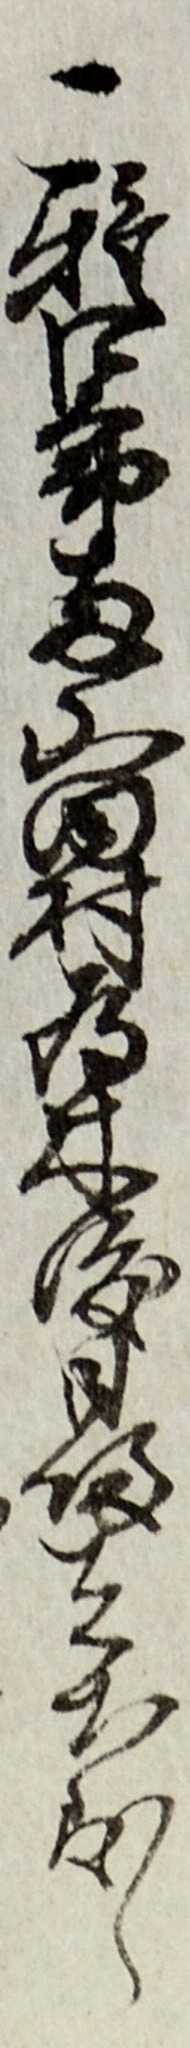一雅四郎両山田村為木渡日帰在出致候
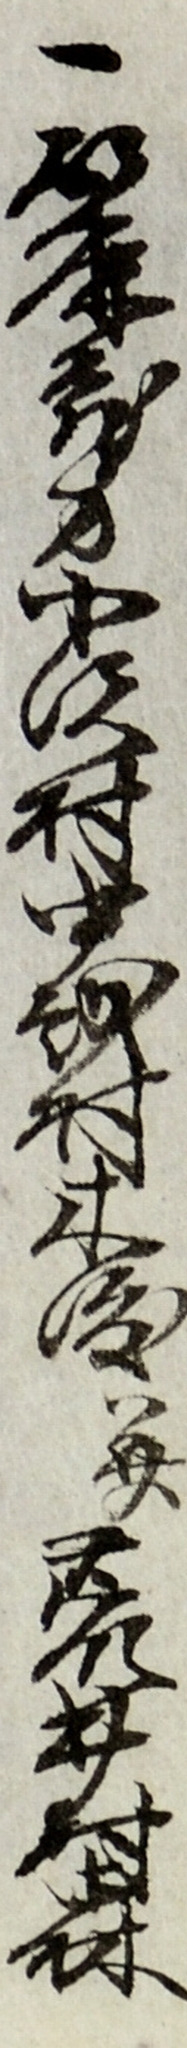一麗蔵方小沢村中越村木渡并荒井村御林
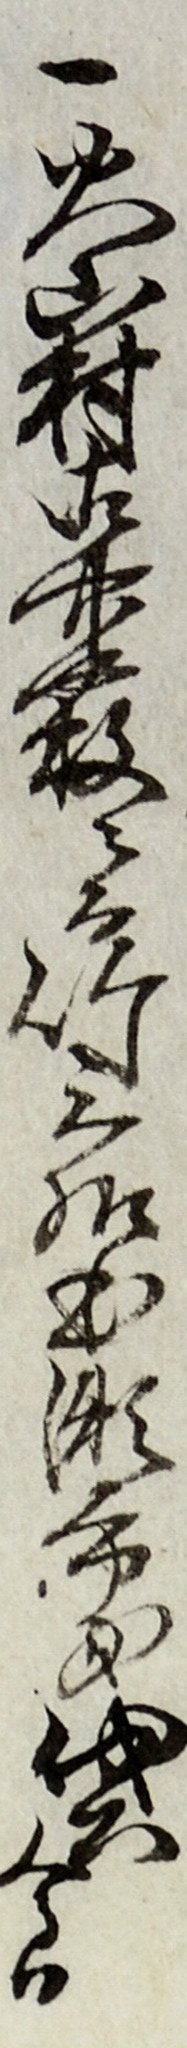一火山村御竹薮ニ而竹三拾本瀬市義伐出今日
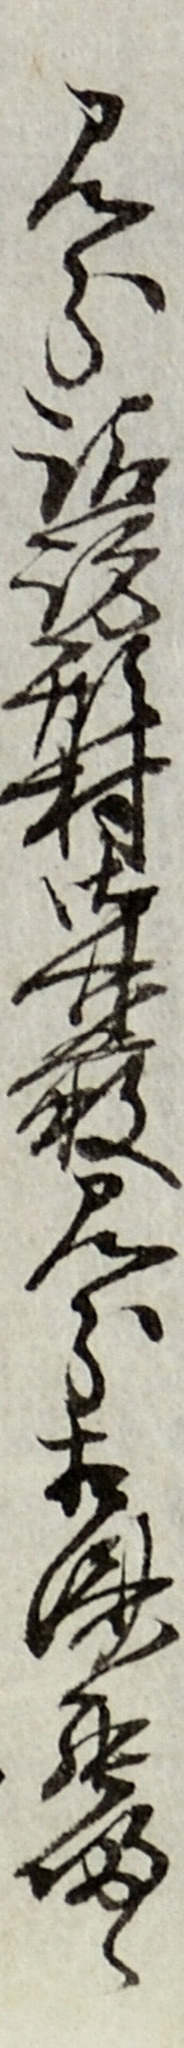見分諏訪形村御竹薮見分相済罷帰候
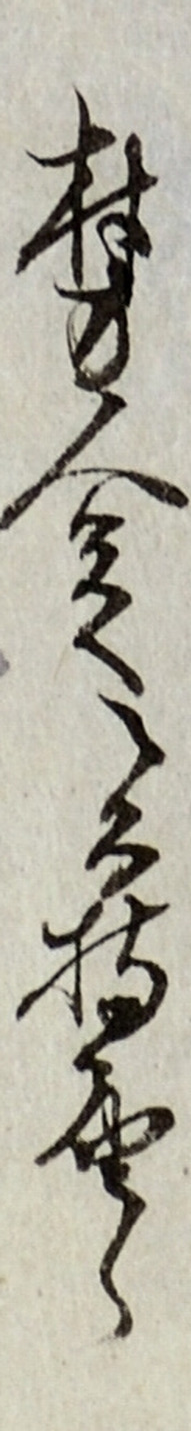林方人足ニ而持届候
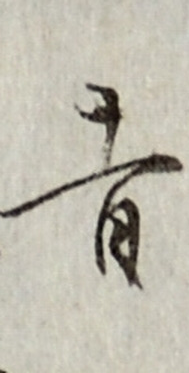十一日
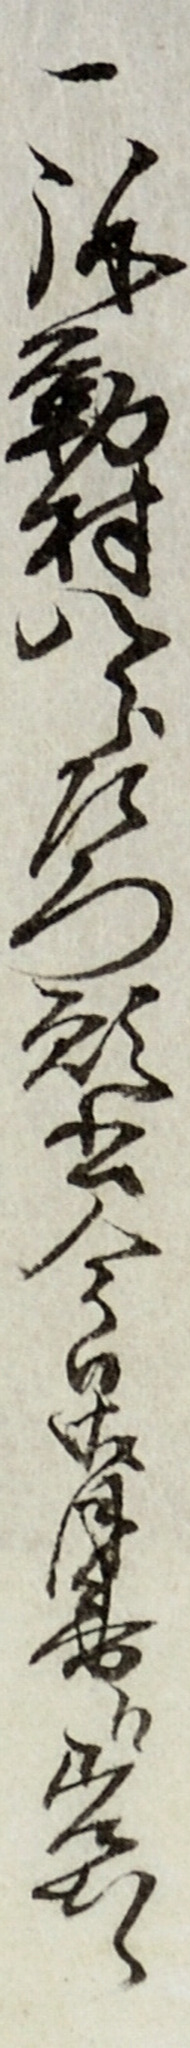一弥勒村八郎左衛門願書今日御月番江差出候
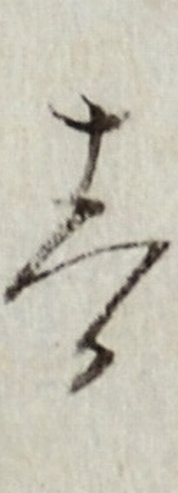十二日
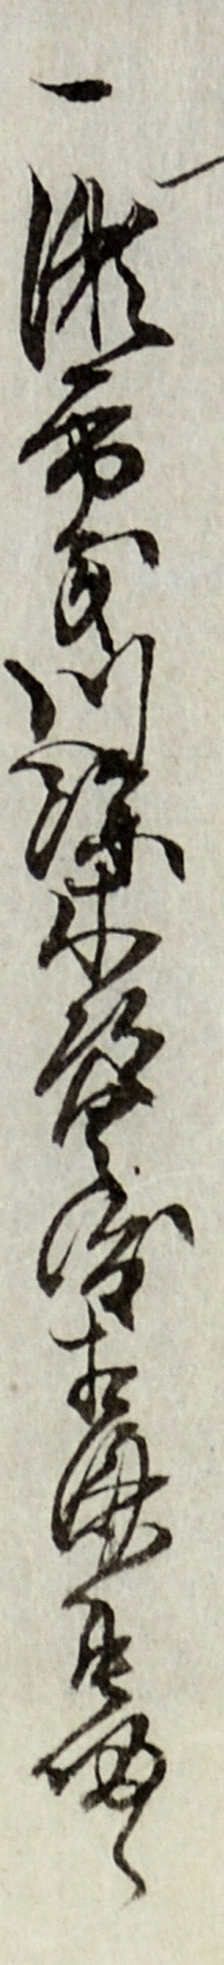一瀬市義川除木道具渡相済罷帰候
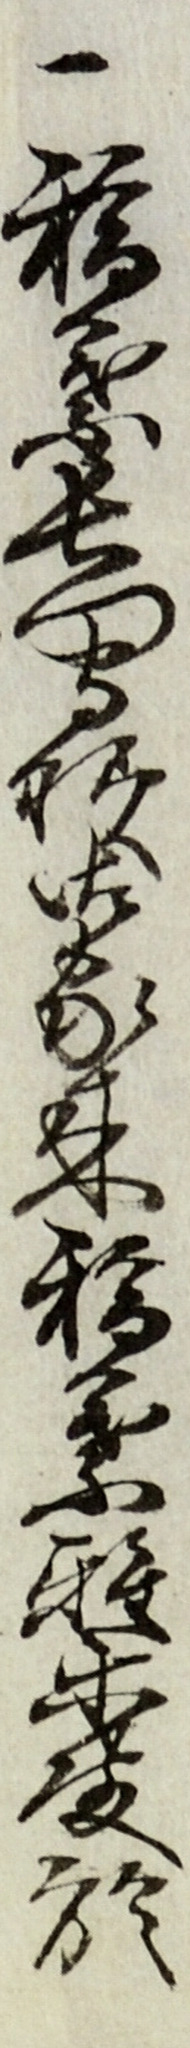一稲葉長門守様御家来稲葉雅楽殿於
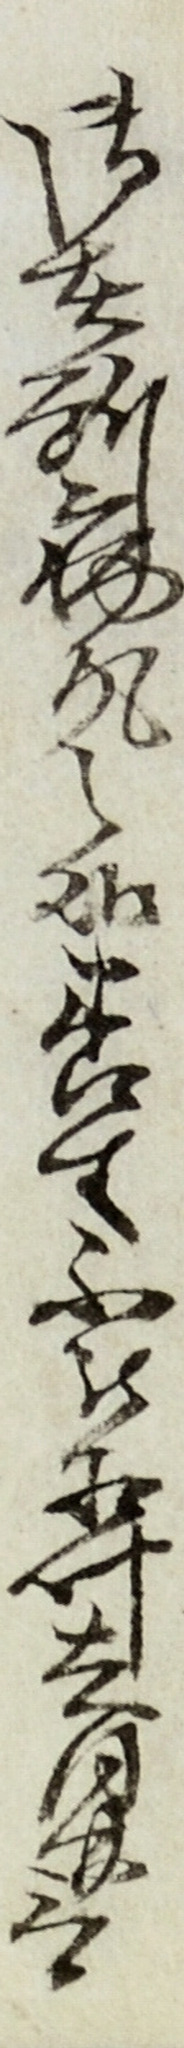御在所病気之処養生不被相叶去月廿三日
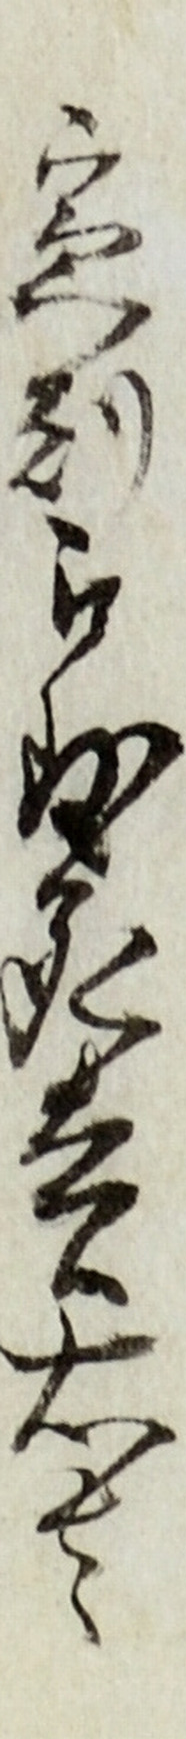寅刻被致死去候右者
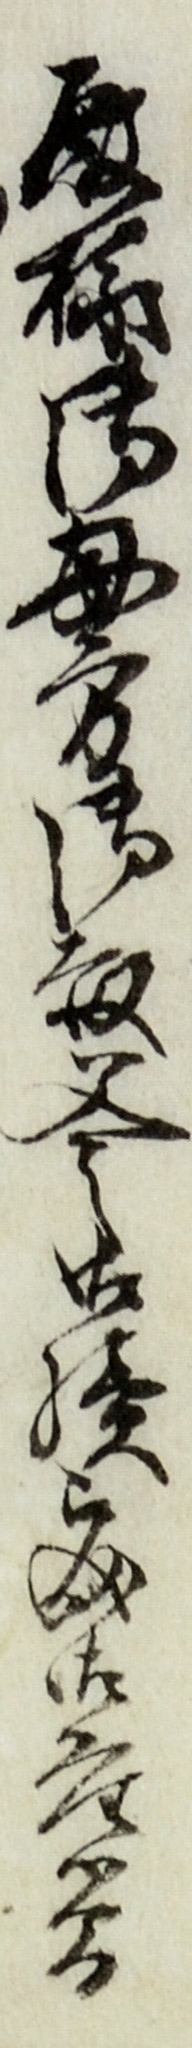殿様御母方御叔父之御続被成御座候間
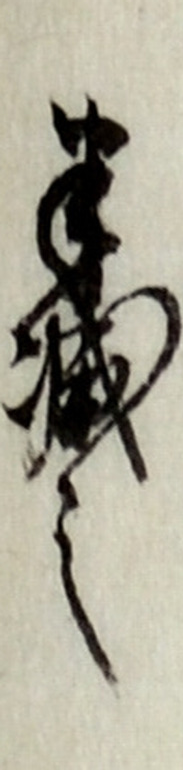半減之
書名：御山方御薪方諸事御用留
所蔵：伊那市立高遠町図書館・合同会社AMANE
